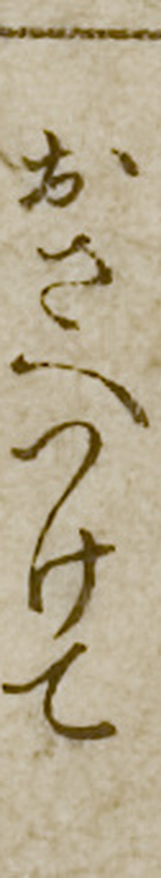おさへつけて
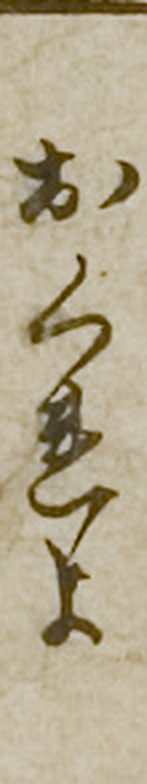おくれよ
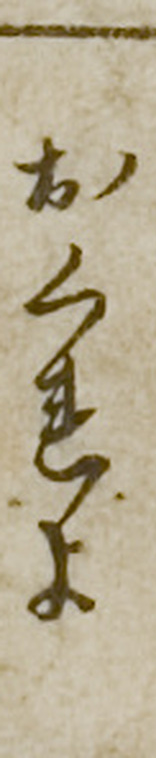おくれよ
